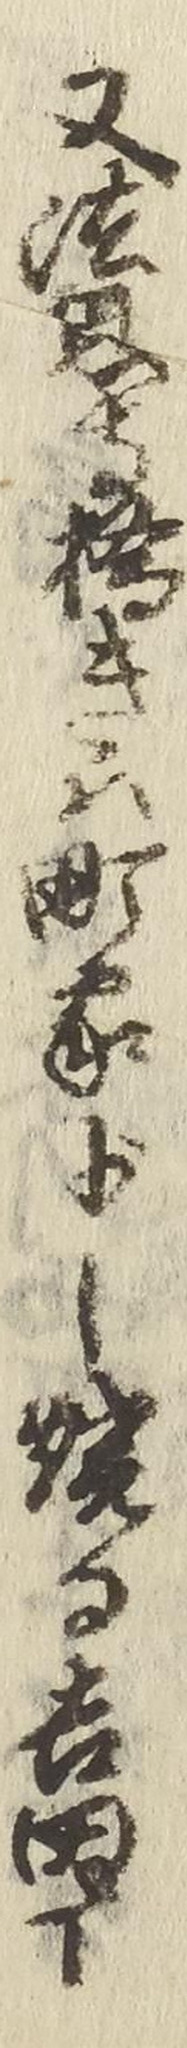又法恩寺橋ｋは町家少し焼る吉田丁
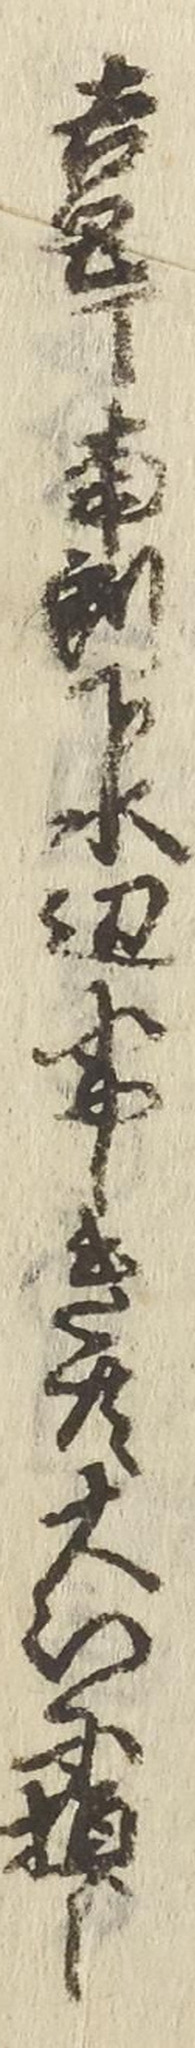吉岡丁南側下水辺小やしき共尾いに損し
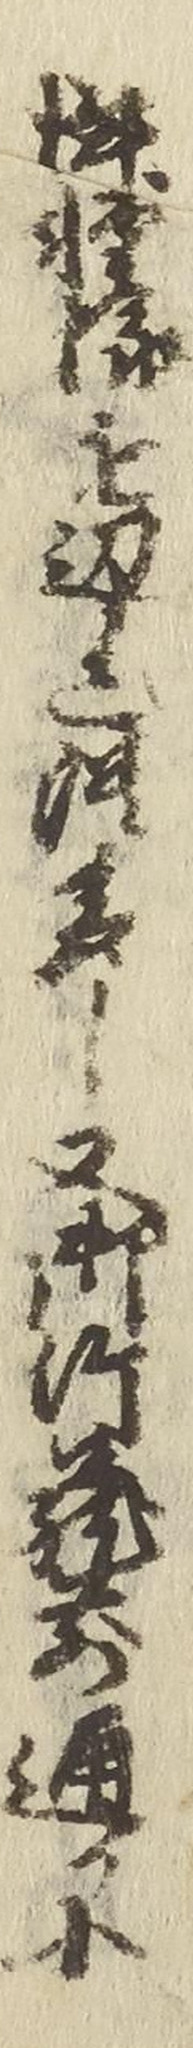津軽様近辺迄潰多し又御竹蔵前通り小
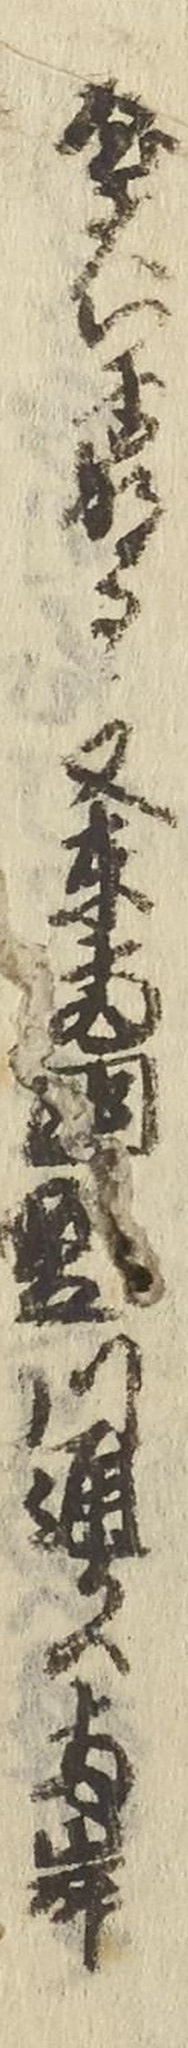屋大いに崩ㇽゝ又東西両国川通りは両岸
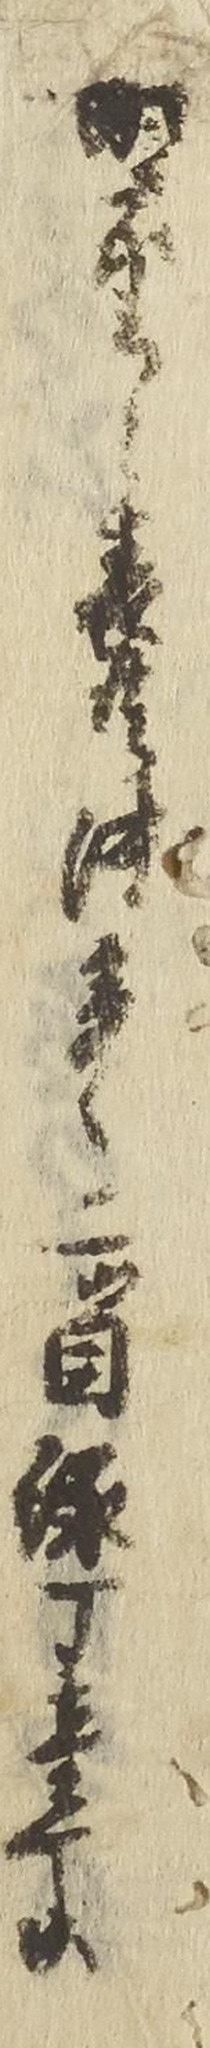町家うら表共潰多く二ツ目緑町壱丁め

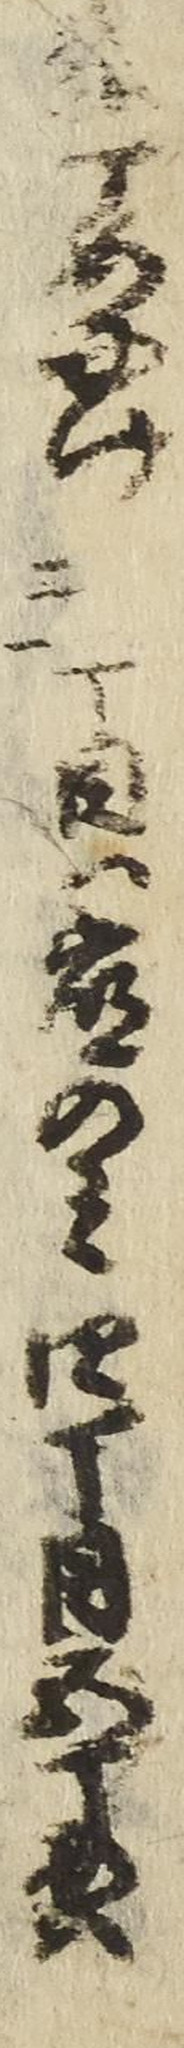弐丁めやけ三丁目は崩のみ四丁目五丁めは
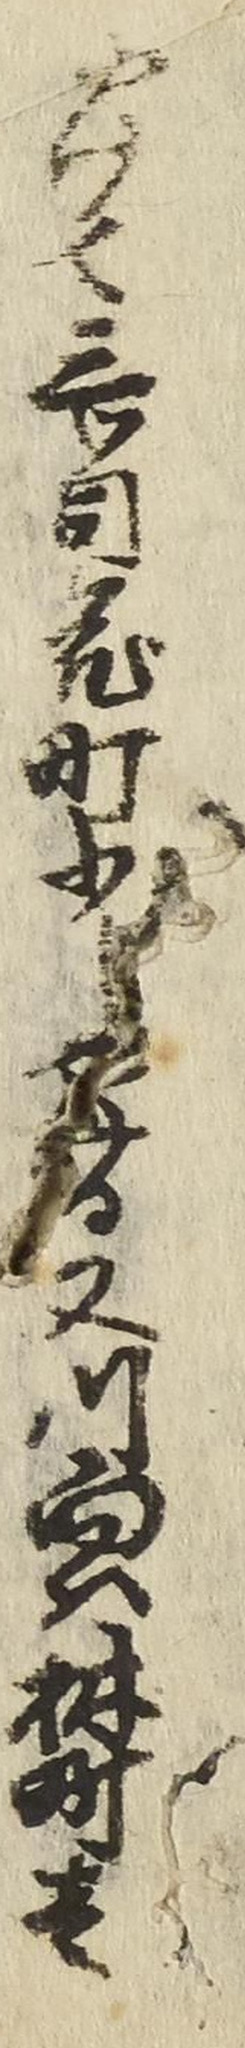やけて三つ目蔵町少しやける又川向は林町壱
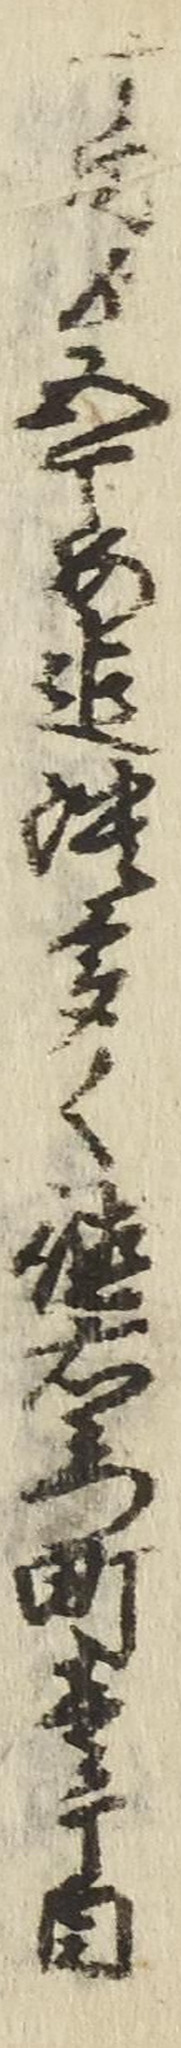丁目ゟ五丁め迄潰多く徳右衛門町壱丁目
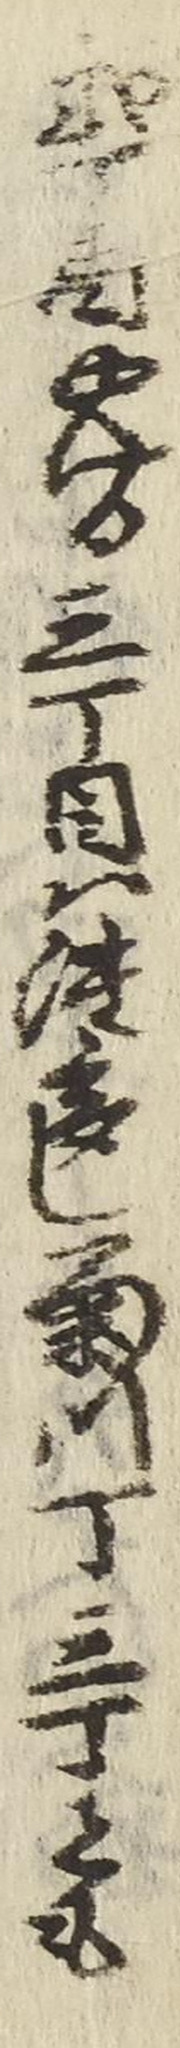弐丁目やける三丁目は潰多し菊川丁三丁とも
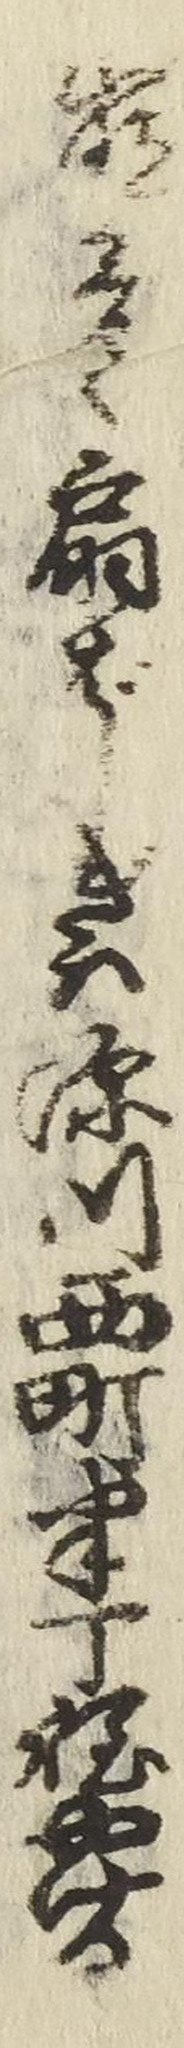崩多く扇ばしぎは深川西町半丁程やける
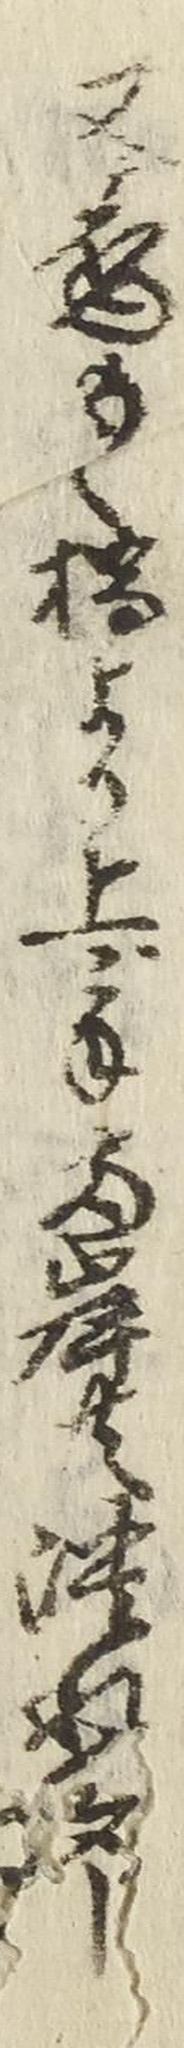又しゆもく橋より上ハ手両岸共潰れ多し
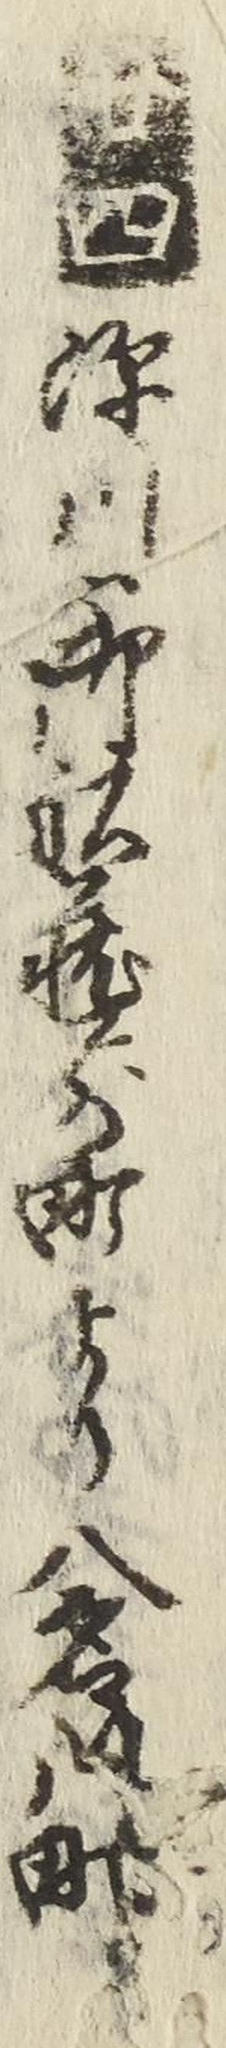廿四深川は御船蔵前町より八名川町
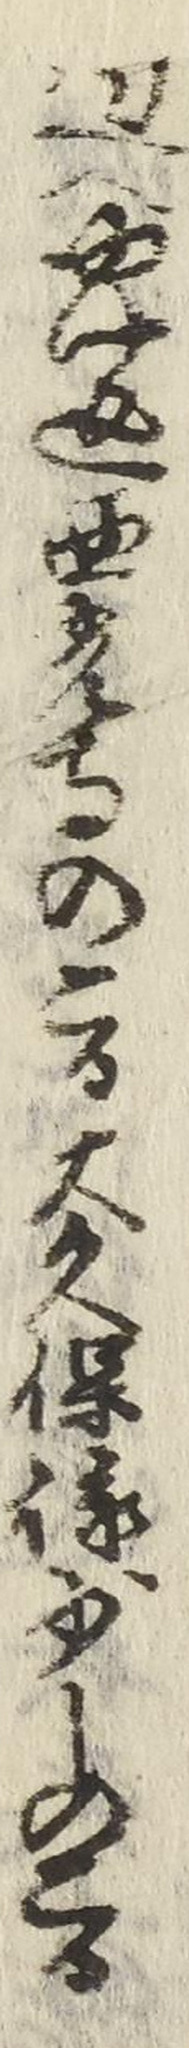辺へやけ込西光寺のこる大久保様少しのこる
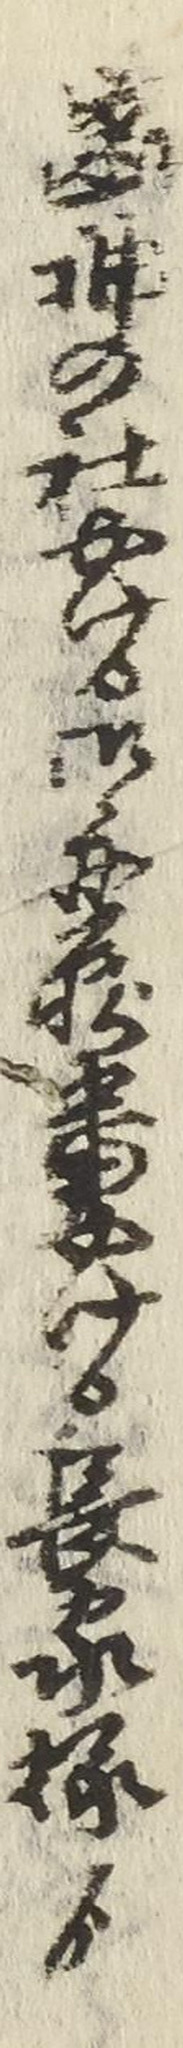歯神の社やける御舟蔵番やける長州様ゟ
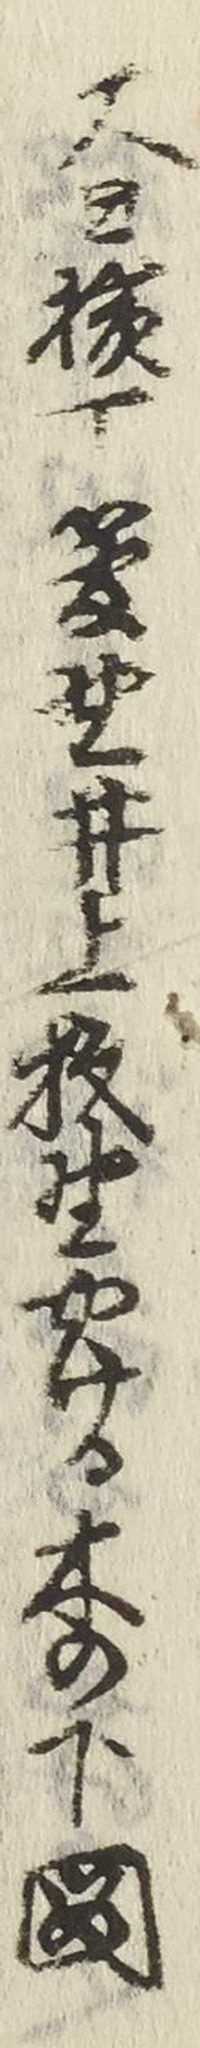大日横丁管野井上牧野やける木の下図
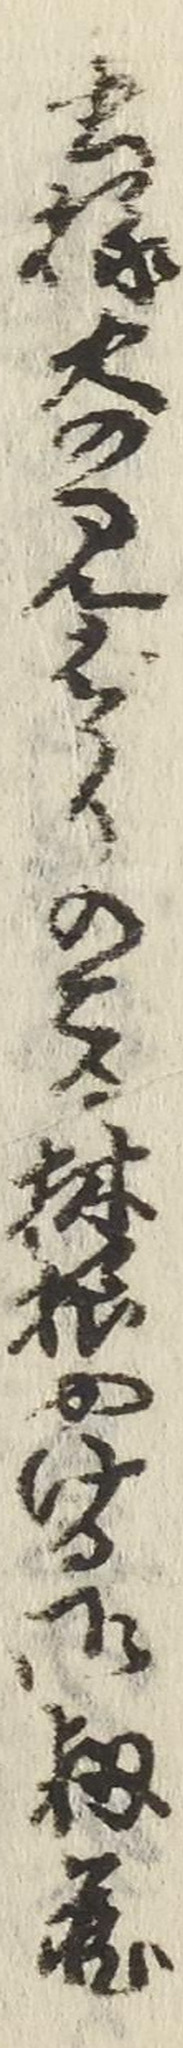書様火の見ばかりのこる林様やける御籾蔵
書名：地震出火　男女死人怪我人書上之寫
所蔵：東京大学地震研究所図書室 Earthquake Research Institute Library, The University of Tokyo, JAPAN
